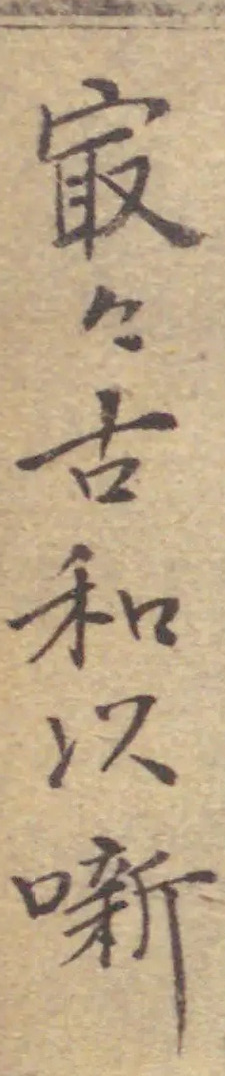最々古和以噺完

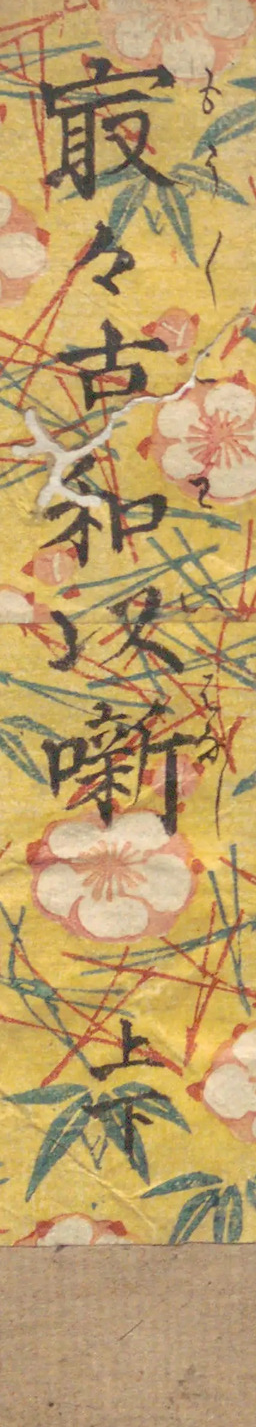最々古和以噺上下
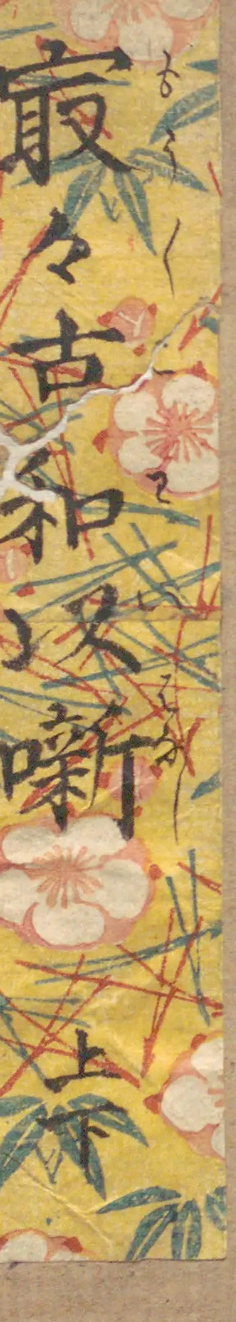最々古和以噺上下

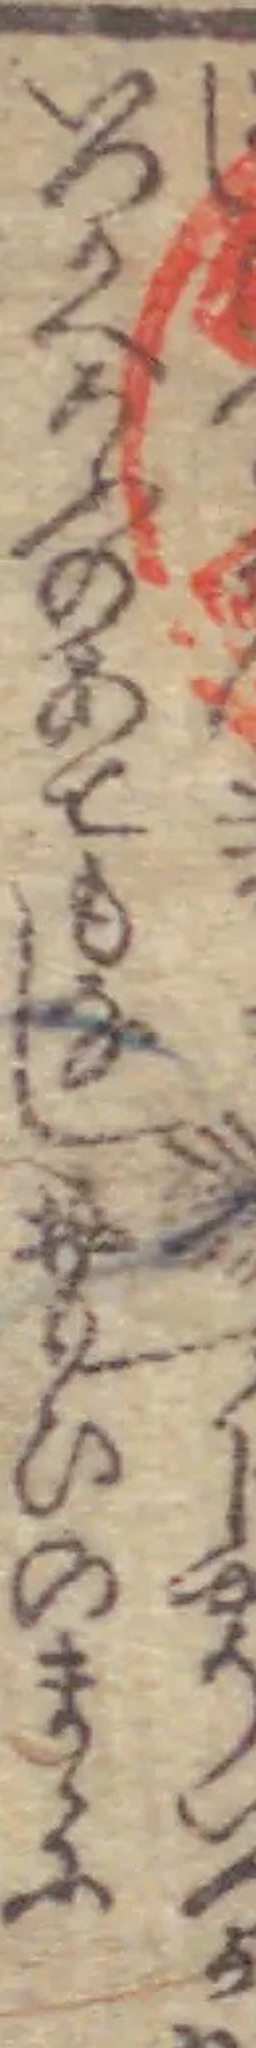いつかへろふのあてもなしおもひのまゝに
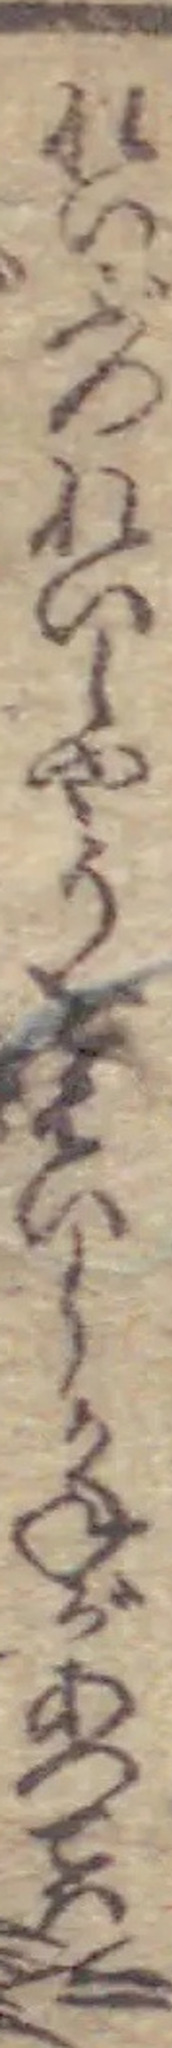れいぶつれいしやうをはいしかねがあつては
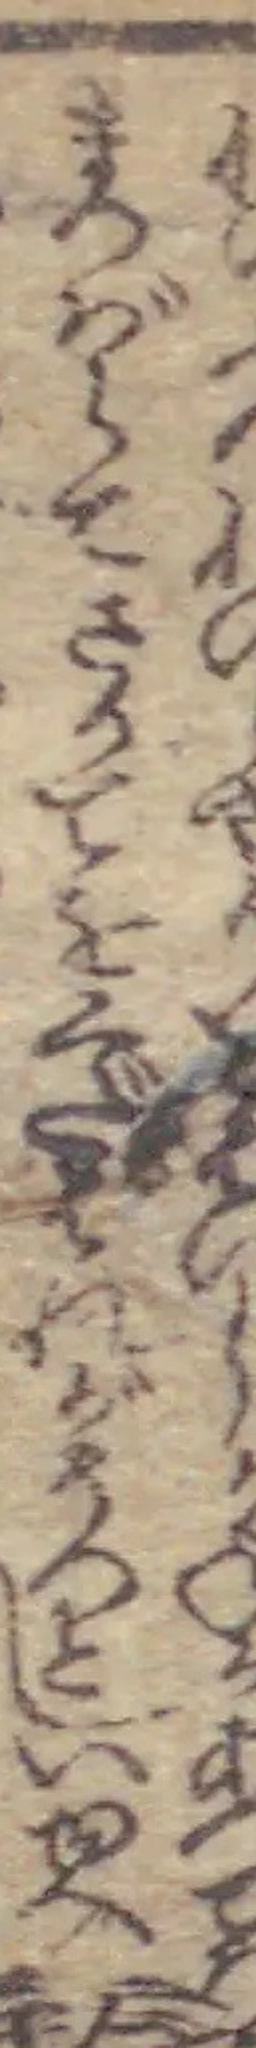まつばらてさかてをくだはれがうつとしいゆへ
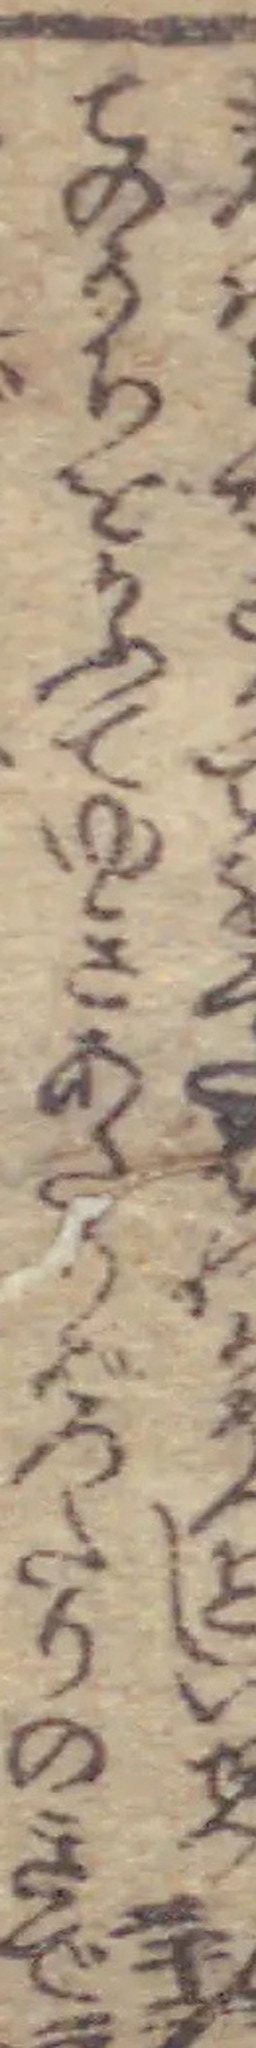てのうちをかふてゆきあたりばつたりのきで
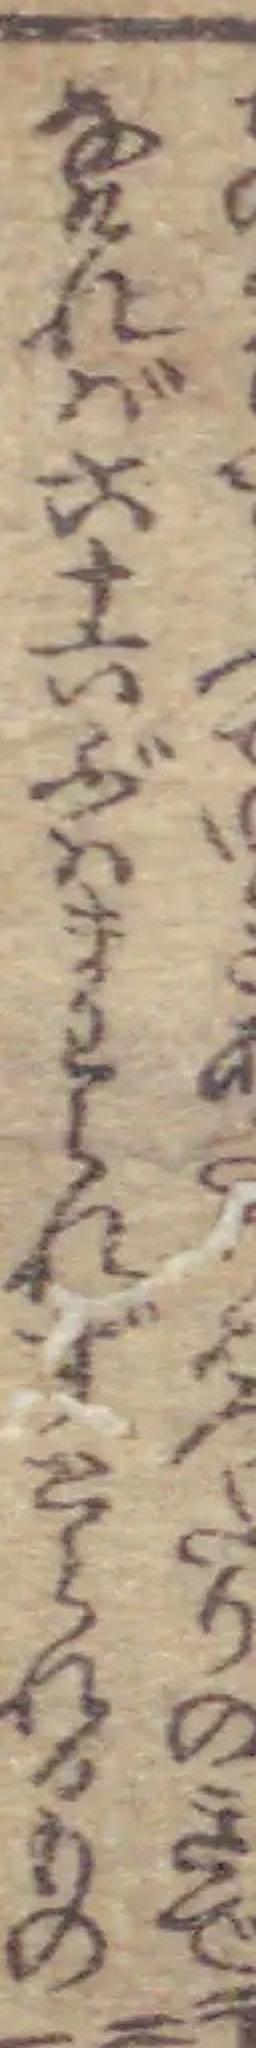なければ六十六ぶはまわられずとられるもの
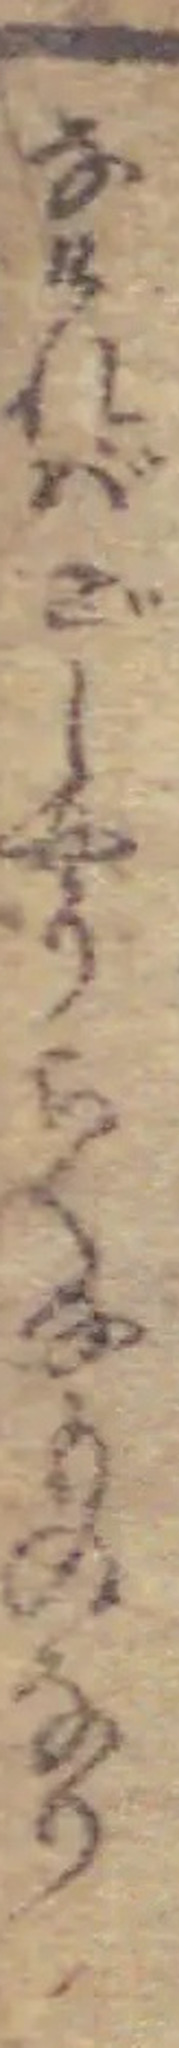なければごしやうらくなものなり
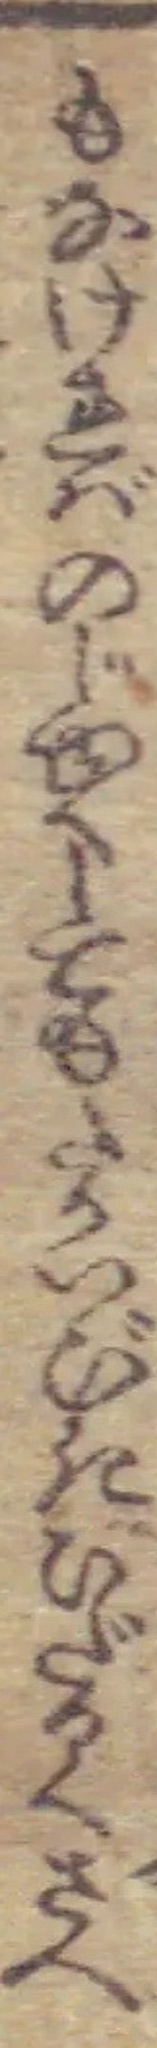もなければのじゆくしてもたかいびきひだるくさへ

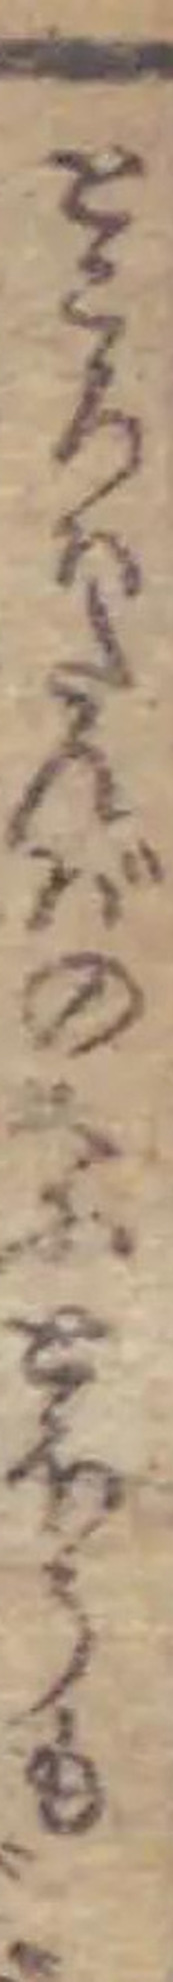ところはたんばのくにとほうも
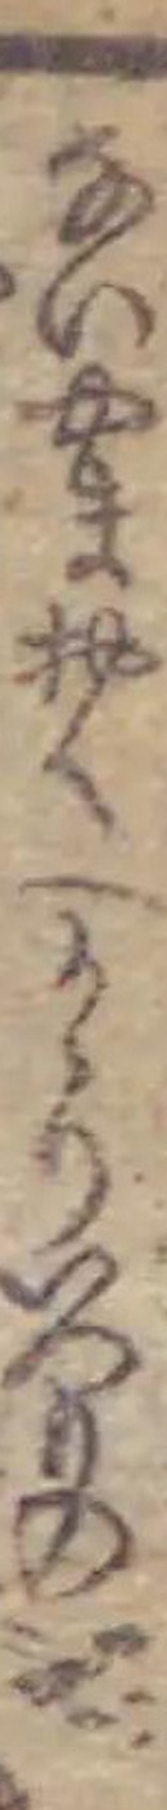ないやまおくかゝりいつもの
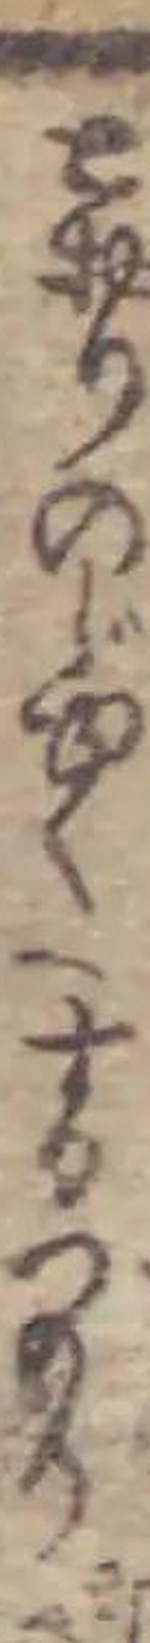とおりのじゆくするつもり
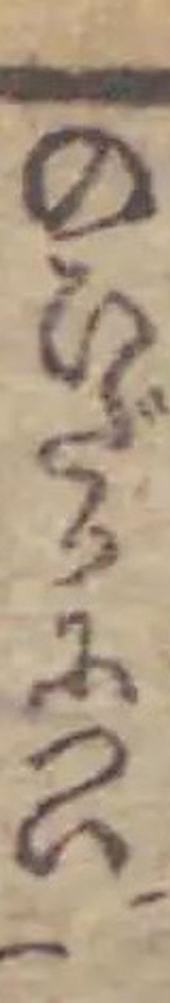のひだかについ
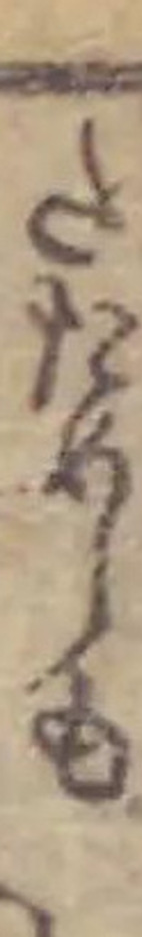たためしも
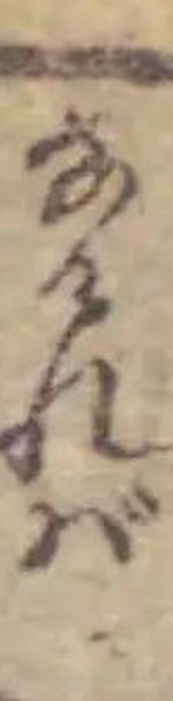なければ
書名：もふもふもふ怖噺 2巻
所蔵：国立国会図書館 National Diet Library, JAPAN
